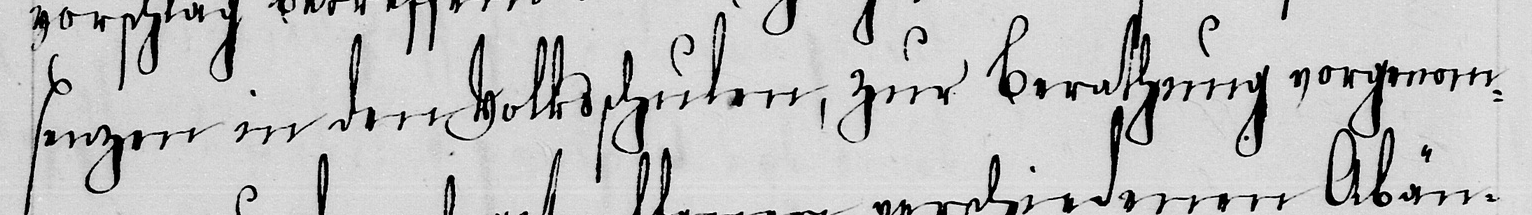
senzen in den Volksschulen, zur Berathung vorgenom¬
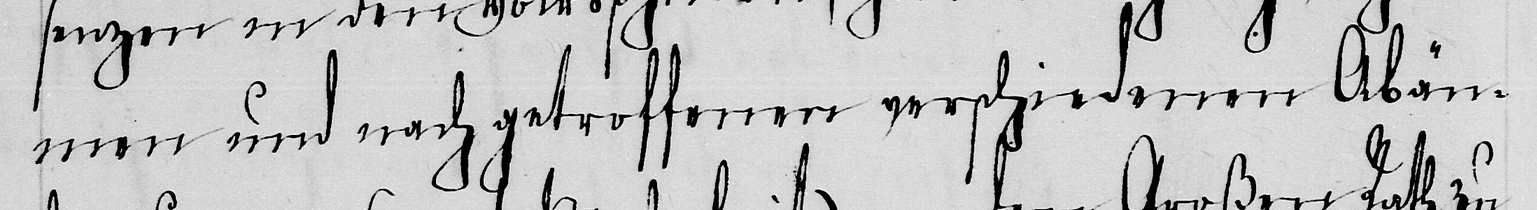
men und nach getroffenen verschiedenen Abän¬
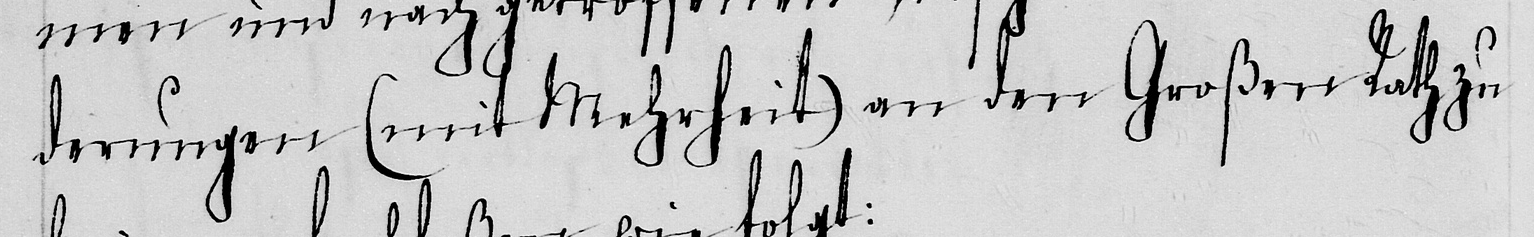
derungen (mit Mehrheit) an den Großen Rath zu
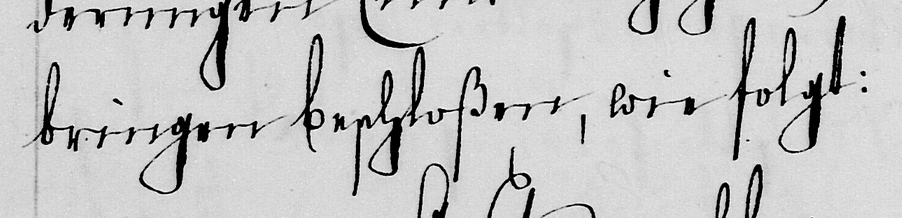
bringen beschloßen, wie folgt:
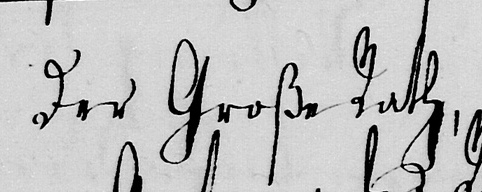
Der Große Rath,
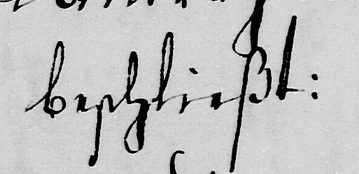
beschließt:
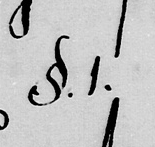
§. 1.
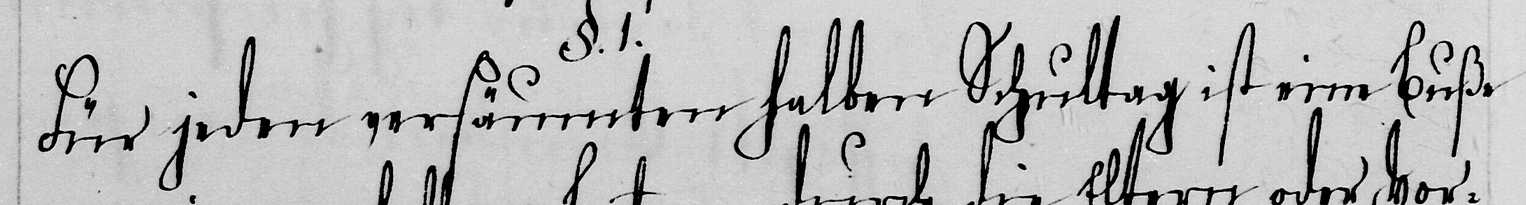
Für jeden versäumnten halben Schultag ist eine Buße
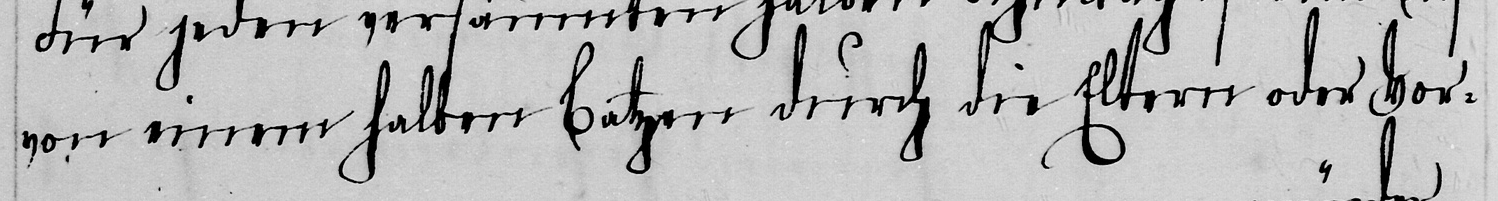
von einem halben Batzen durch die Eltern oder Vor-
